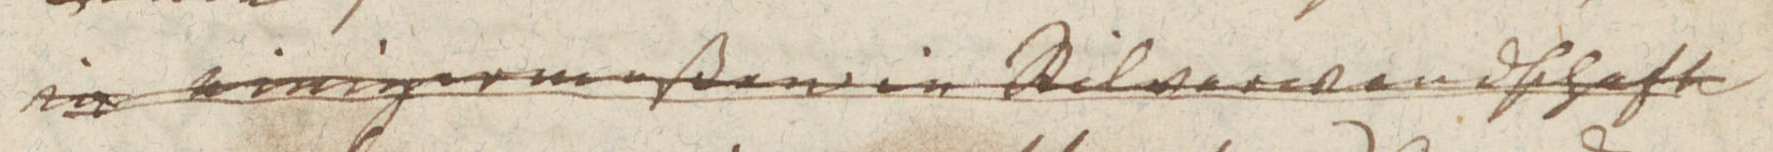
in einigermassen in Stilverwandschaft
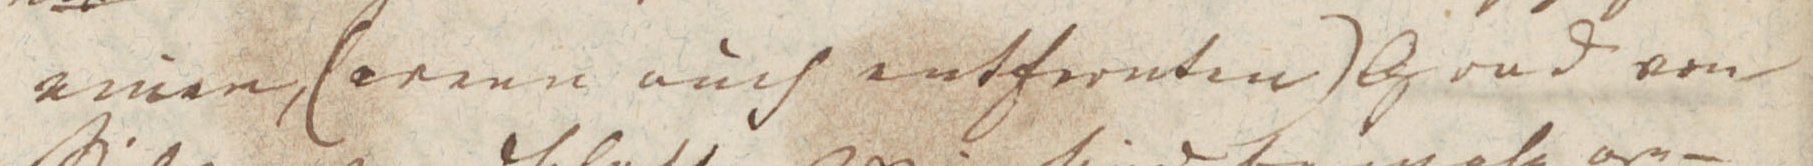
einen, (wenn auch entfernten) Grad von
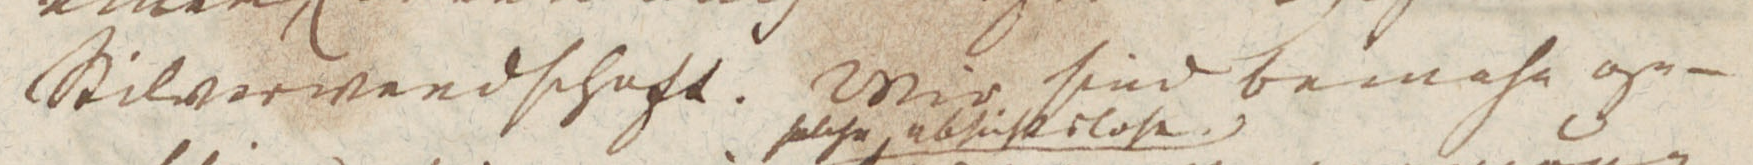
Stilverwandschaft. Wir sind beinahe ge-
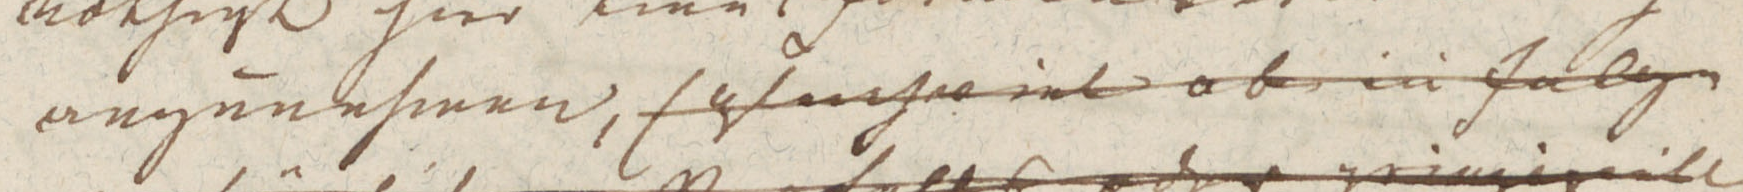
anzunehmen, (gleichviel ob in Folge
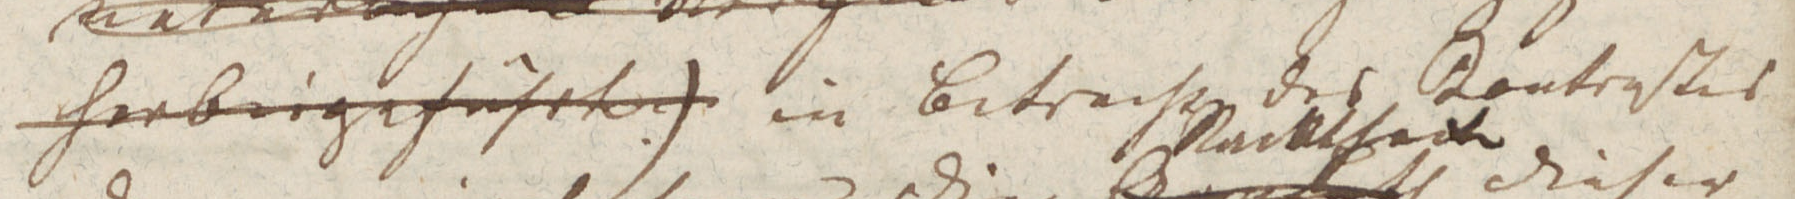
herbeigeführte) in Betracht des Kontrastes
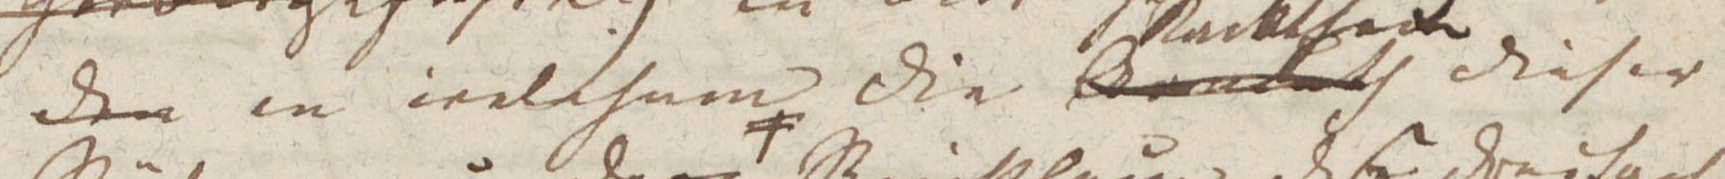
den in welchem die Armuth Nacktheit dieser
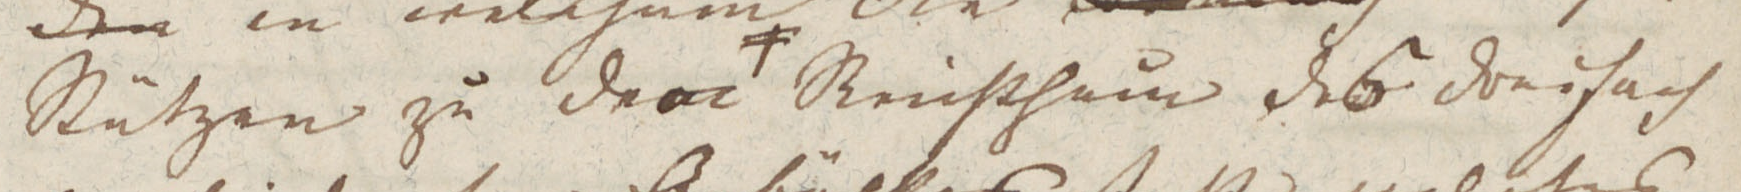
Stützen zu dem % Reichthum ders dreifach
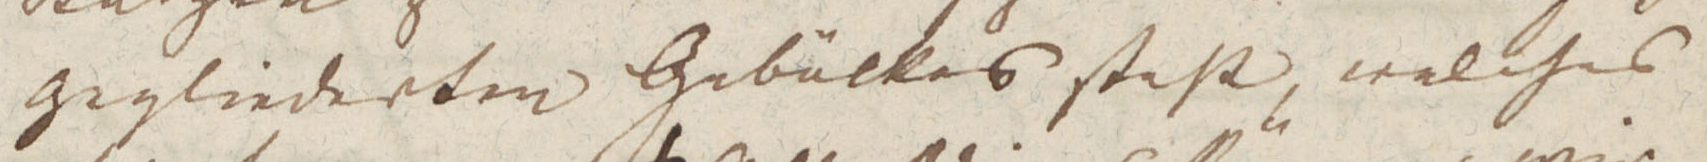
gegliederten Gebälkes steht, welches
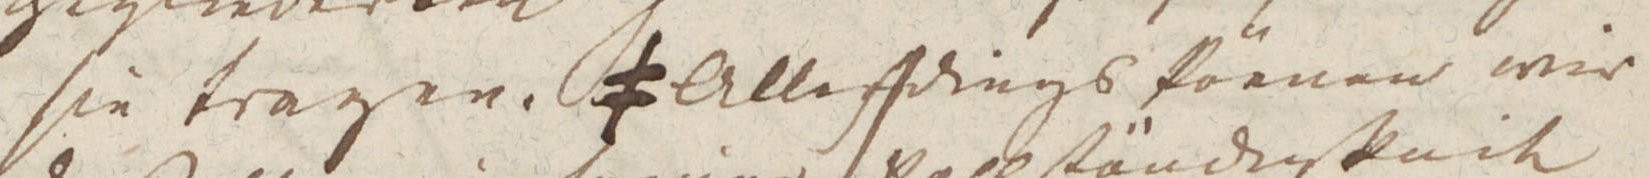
sie tragen. % Allerdings können wir
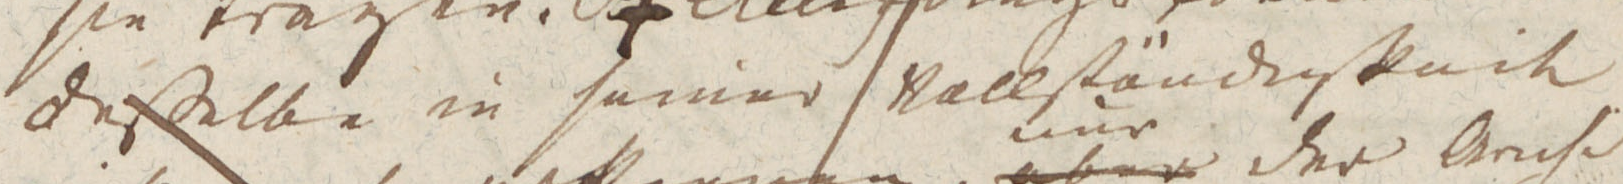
dasselbe in seiner Vollständigkeit
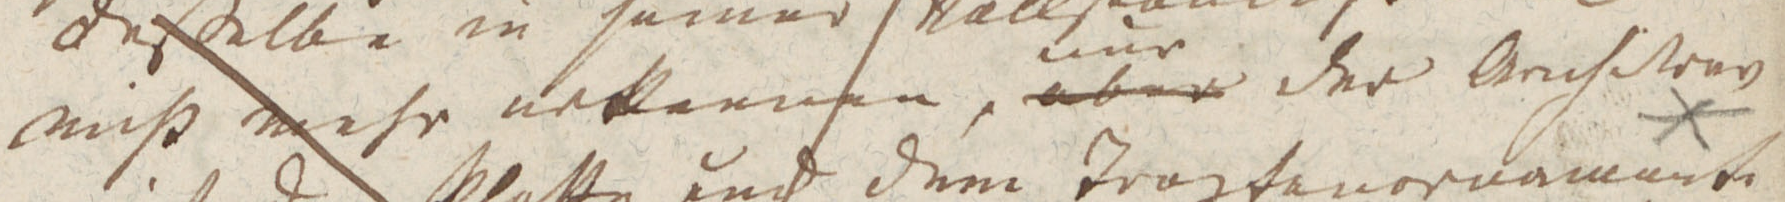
nicht mehr erkennen, aber nur der Architrav
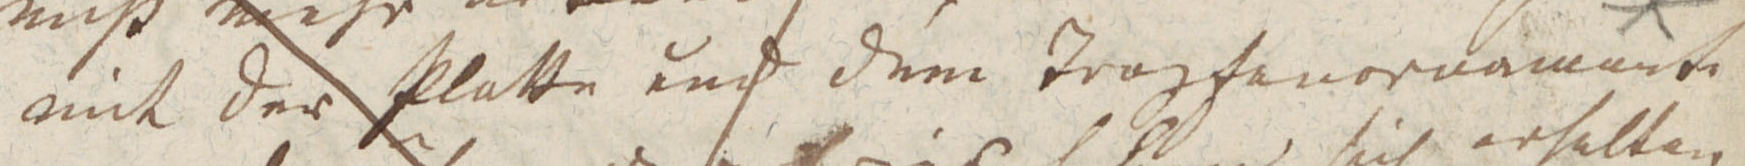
mit der Platte und dem Tropfenornament %
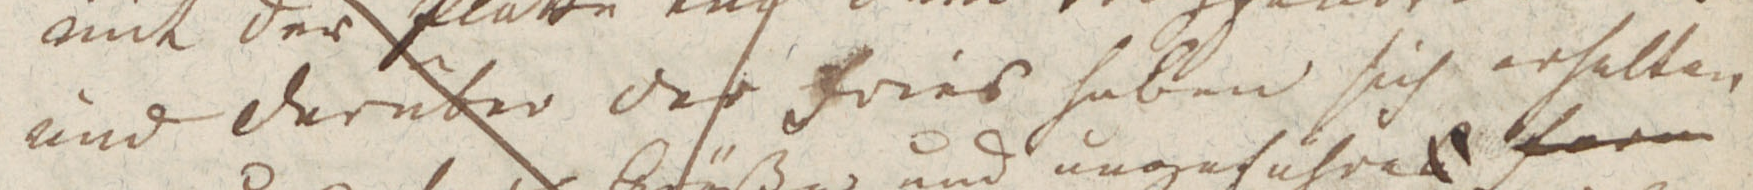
und darüber der Fries haben sich erhalten
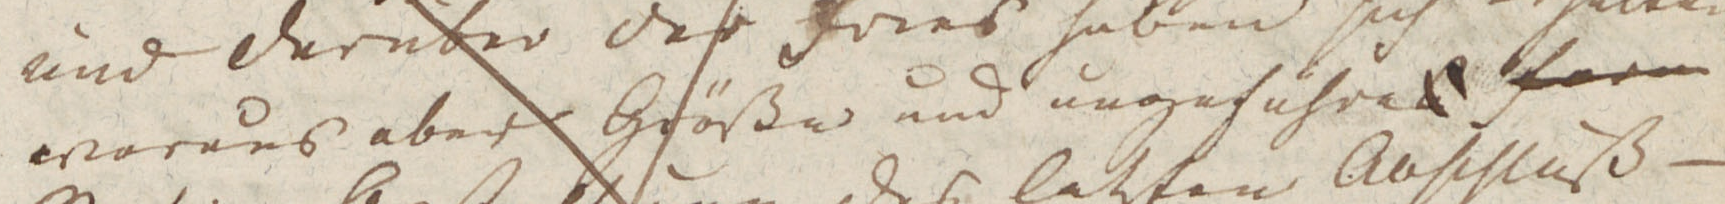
woraus aber Grösse und ungefähres Form
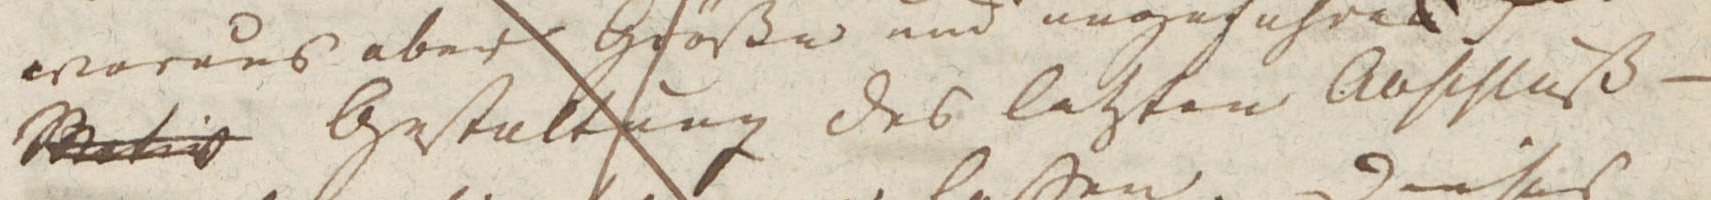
Motiv Gestaltung des letzten Abschluss-
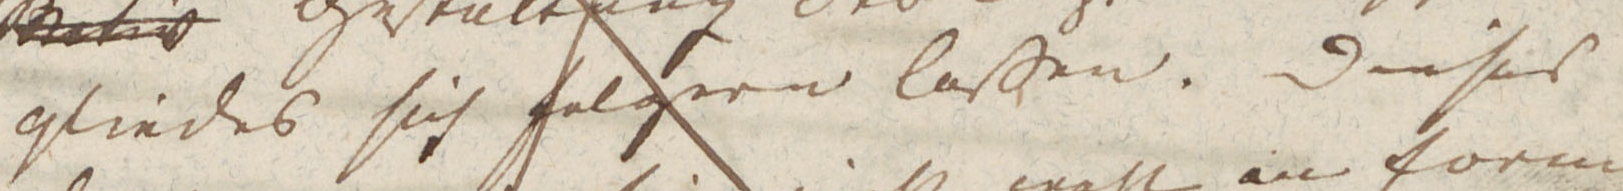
gliedes sich folgern lassen. Dieses
